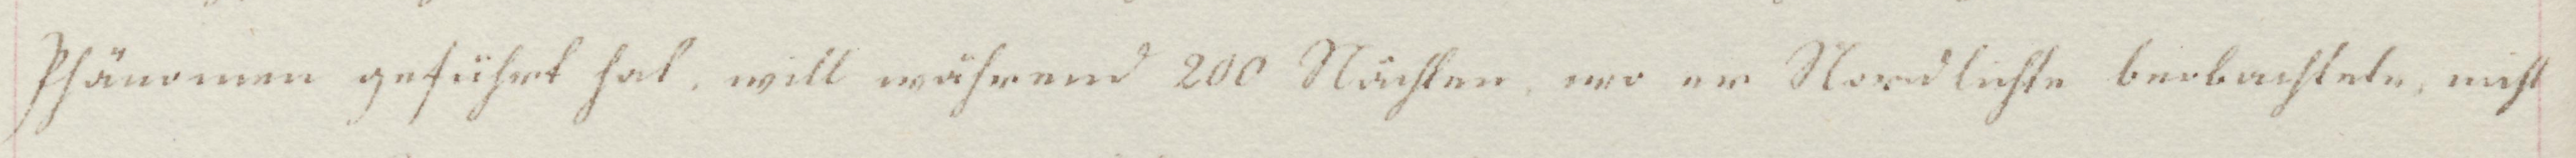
Phänomen geführt hat, will während 200 Nächten, wo er Nordlichte beobachtete, nicht
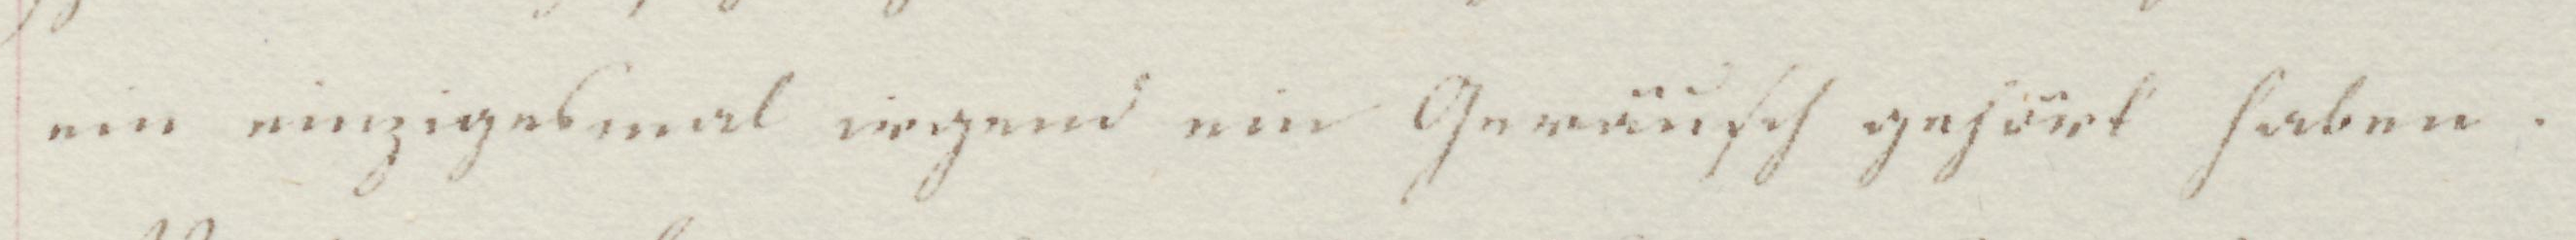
ein einzigesmal irgend ein Geräusch gehört haben.
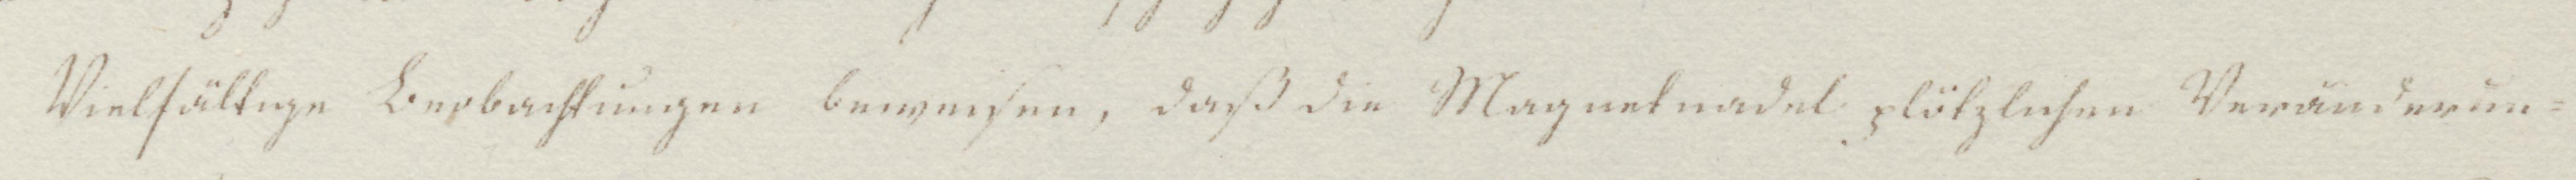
Vielfältige Beobachtungen beweisen, daß die Magnetnadel plötzlichen Veränderun-
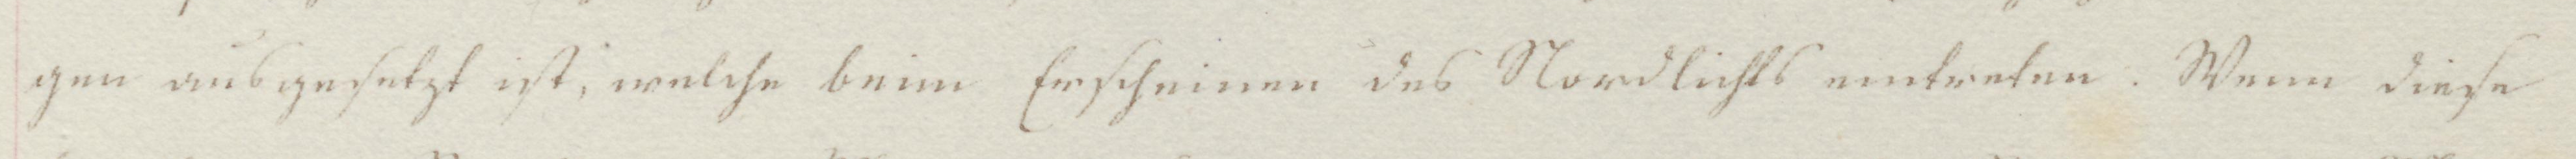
gen ausgesetzt ist, welche beim Erscheinen des Nordlichts eintreten. Wenn diese
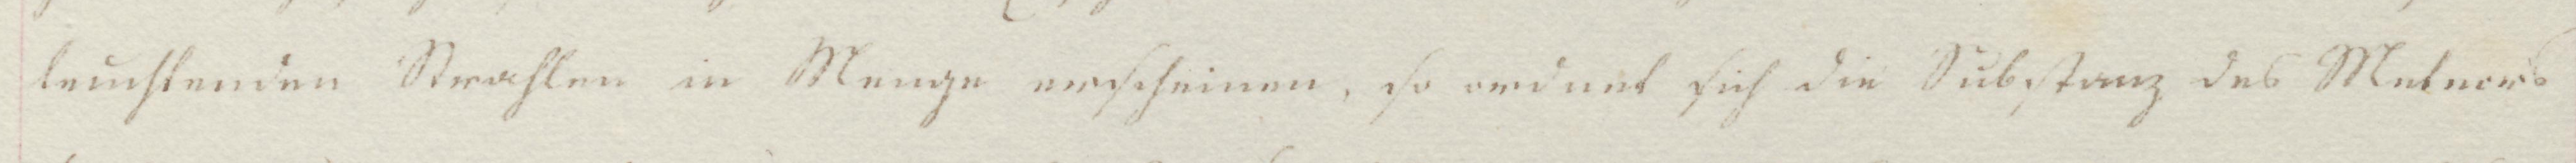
leuchtenden Strahlen in Menge erscheinen, so ordnet sich die Substanz des Meteors
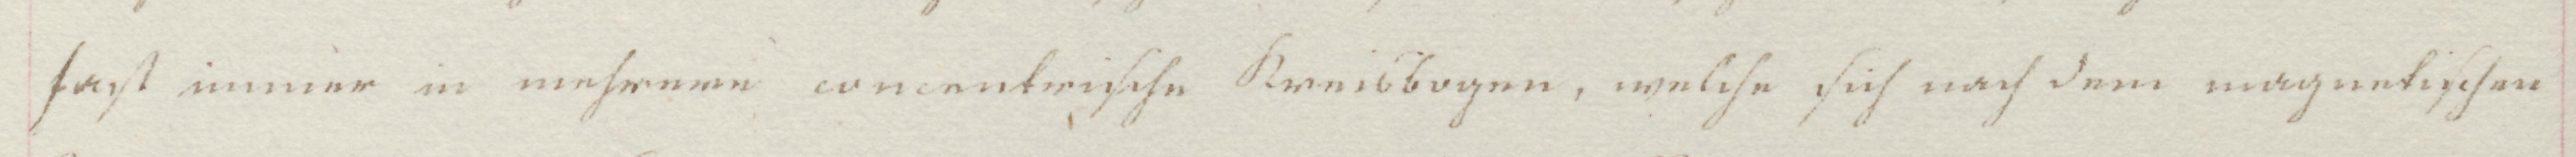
fast immer in mehrere concentrische Kreisbogen, welche sich nach dem magnetischen
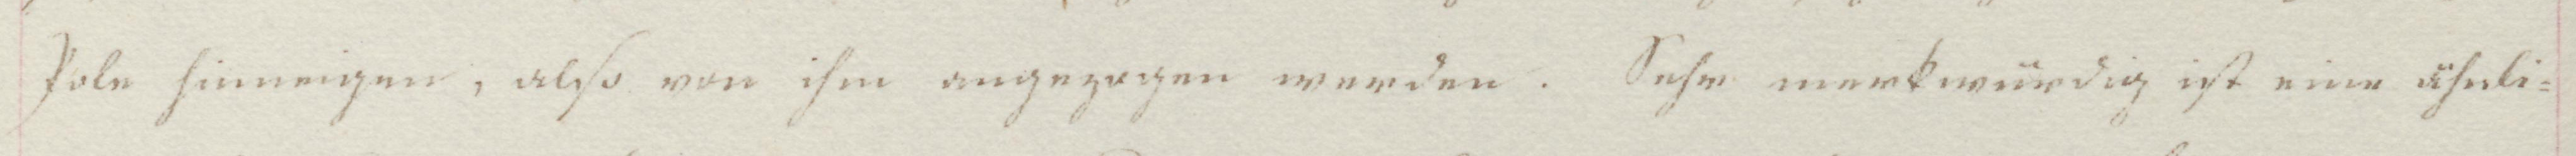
Pole hinneigen, also von ihm angezogen werden. Sehr merkwürdig ist eine ähnli-
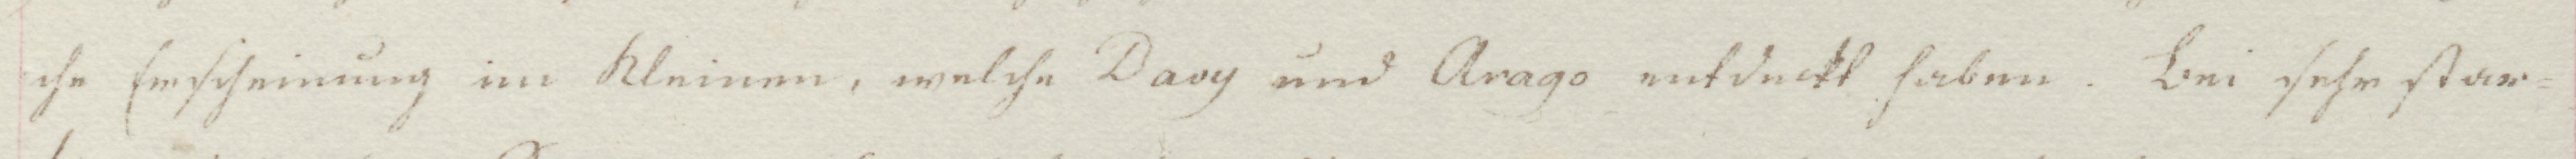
che Erscheinung im Kleinen, welche Davy und Arago entdeckt haben. Bei sehr star-
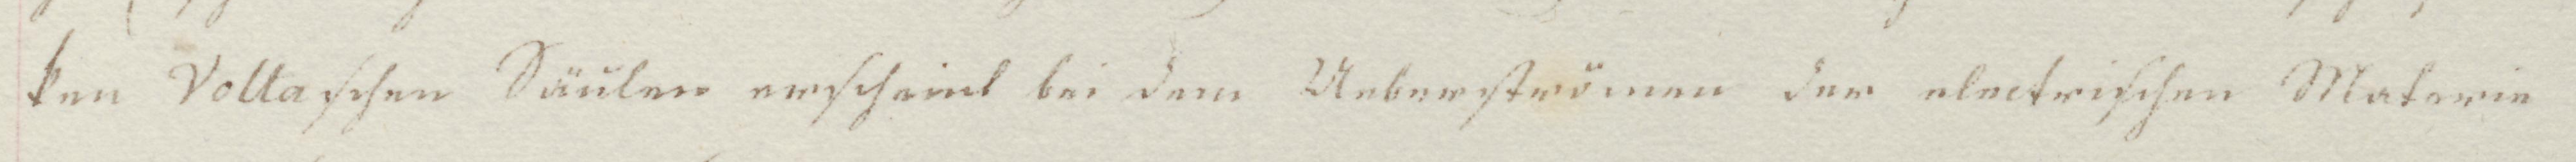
ken Voltaschen Säulen erscheint bei dem Ueberströmen der electrischen Materie
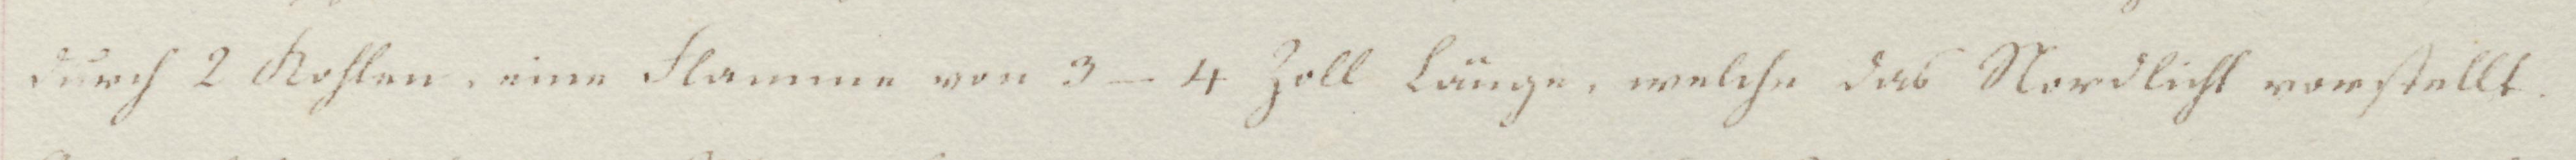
durch 2 Kohlen, eine Flamme von 3–4 Zoll Länge, welche das Nordlicht vorstellt.
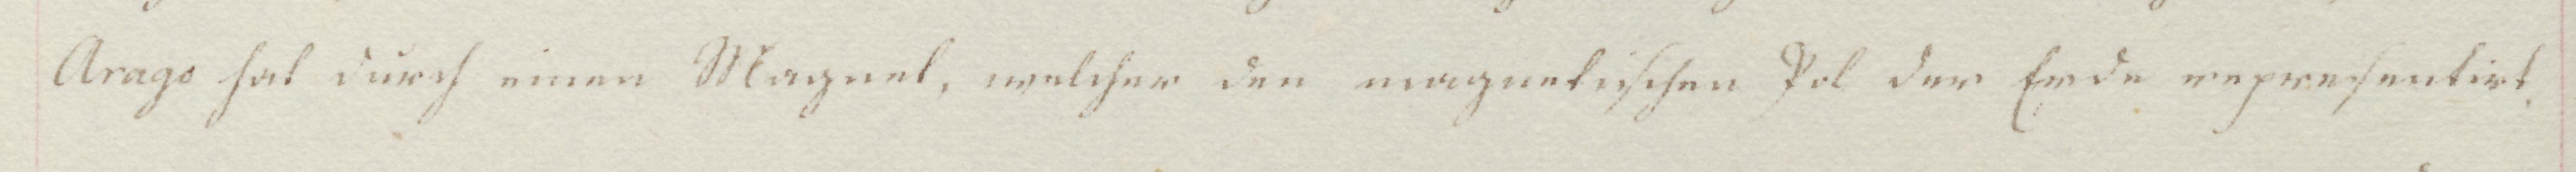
Arago hat durch einen Magnet, welcher den magnetischen Pol der Erde representirt,
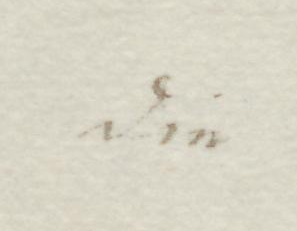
die
